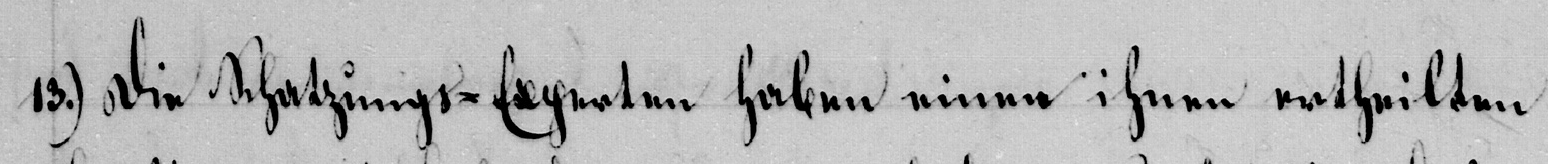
13.) Die Schatzungs-Experten haben einen ihnen ertheilten
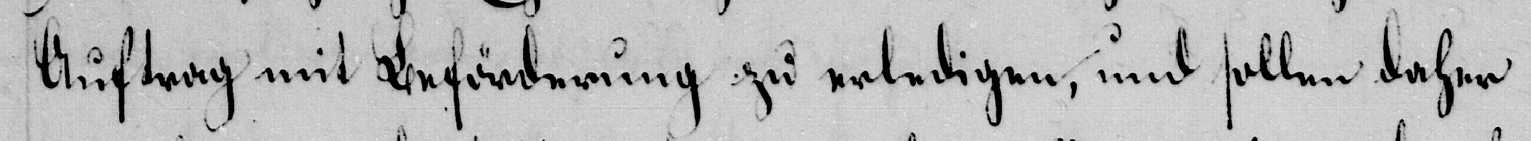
Auftrag mit Beförderung zu erledigen, und sollen daher
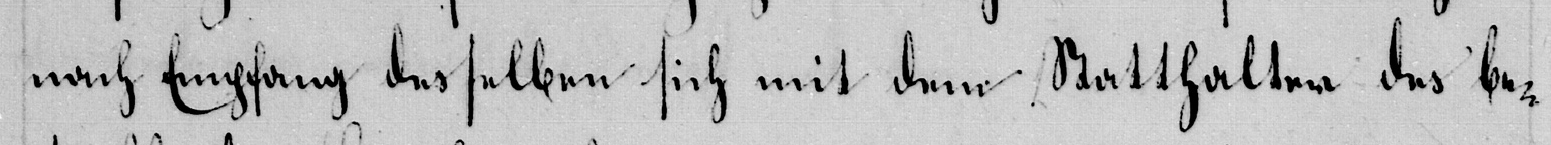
nach Empfang desselben sich mit dem Statthalter des be¬
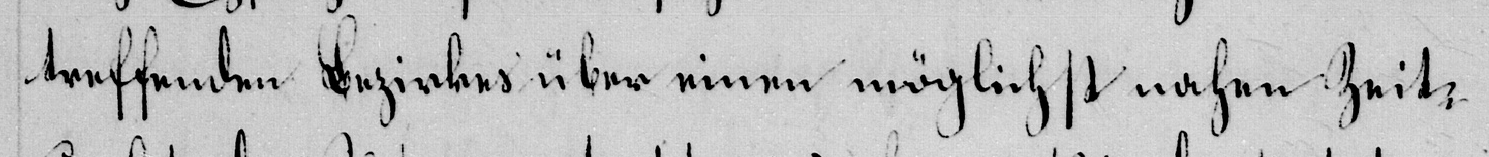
treffenden Bezirkes über einen möglichst nahen Zeit¬
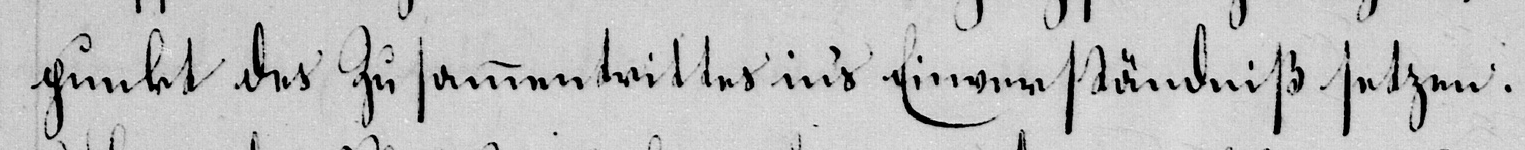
punkt des Zusammentrittes in’s Einverständniß setzen.
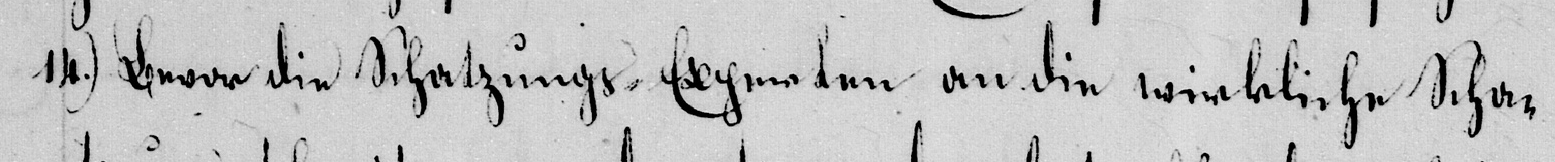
14.) Bevor die Schatzungs-Experten an die wirkliche Scha¬
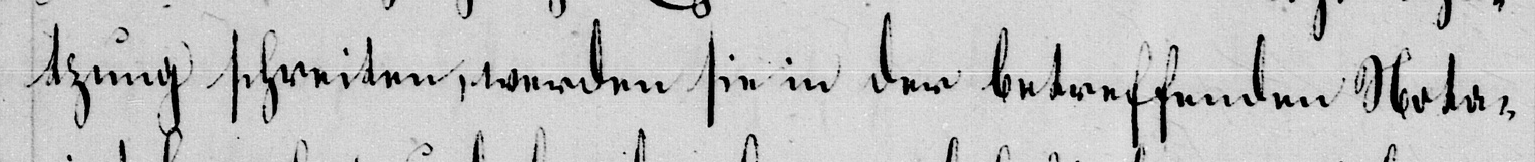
tzung schreiten, werden sie in der betreffenden Nota¬
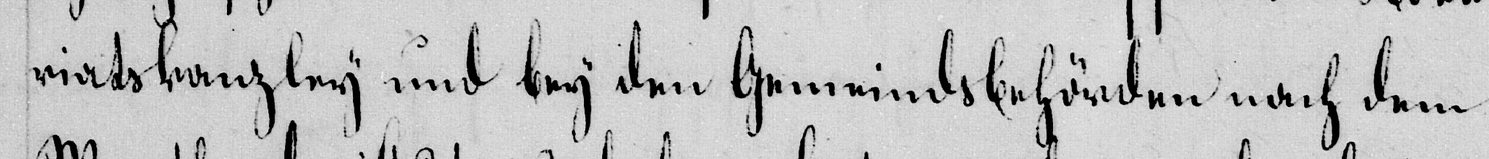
riatskanzley und bey den Gemeindsbehörden nach dem
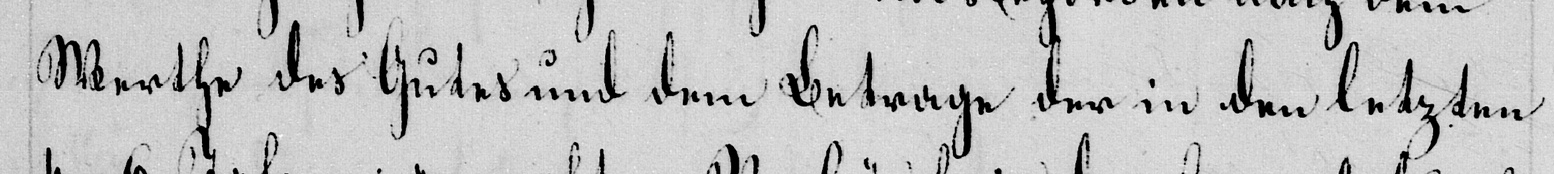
Werthe des Gutes und dem Betrage der in den letzten
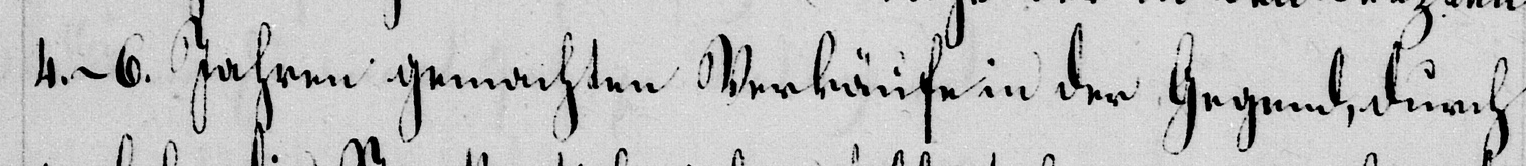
4.–6. Jahren gemachten Verkäufe in der Gegend, durch
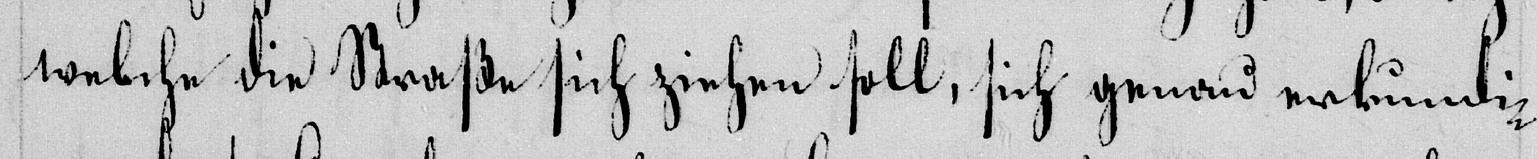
welche die Straße sich ziehen soll, sich genau erkundi¬
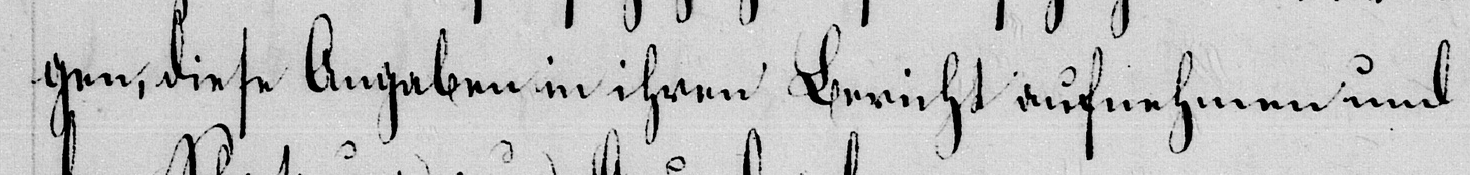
gen, diese Angaben in ihren Bericht aufnehmen und
